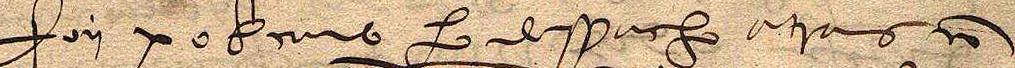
foi pobicado ho despacho atras cō
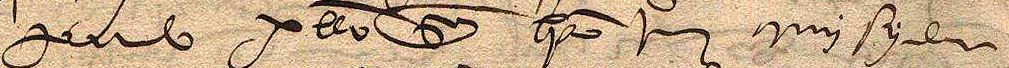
teudo pl̄lo s̄or bpō Imquysydor
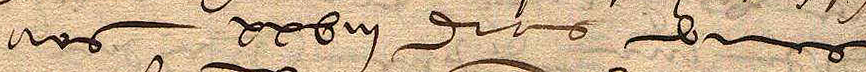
aos xxbiij dias do mes
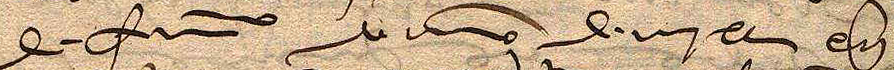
de feuro do an̄o de mjll e q̄
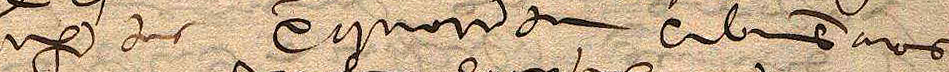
nhētos e quorēta e dous anos
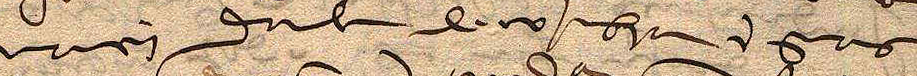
na cydade de coJnbra ē suas
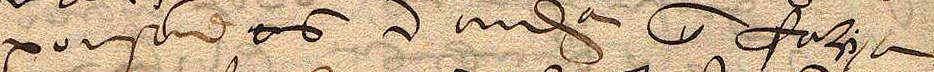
pousadas ē audja q̄ fazya
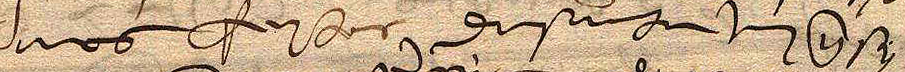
nos feytos da santa Jmq̄sy
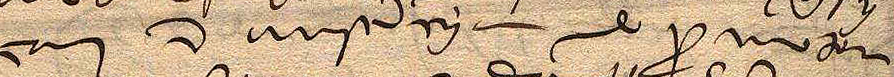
çam ē ausēcya do ꝓmotor
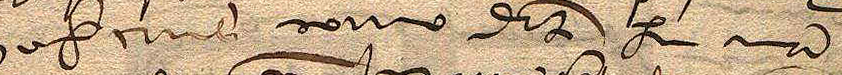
pobicado como dito he mā
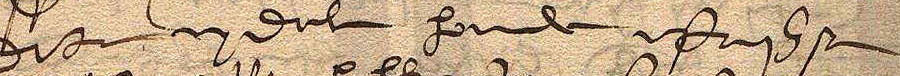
dita cydade honde esta p̄sa
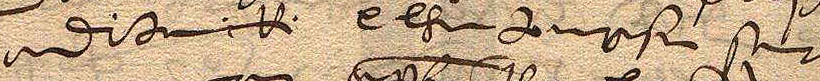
a dita .Re e lhe tomase sua
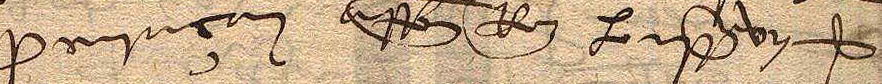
ꝓcuraçam āffom Roz ho esp̄vy
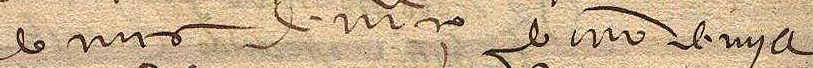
do mes de m̄ço do an̄o de mjll
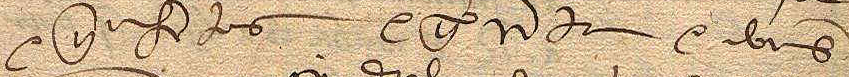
e q̄nhētos e q̄orēta e dous
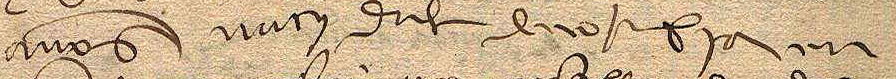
an̄os na cydade de coJnbra eu
